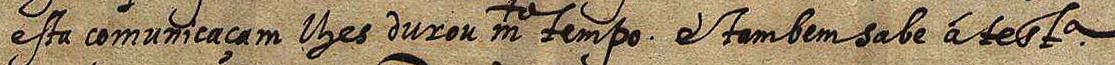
esta comunicaçam lhes durou mto tempo. e tambem sabe á testa.
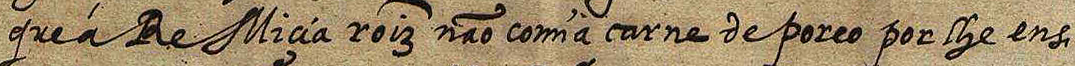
que á Re Miçia roīz não comia carne de porco por lhe ensi
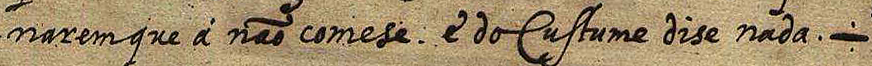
narem que a não comese. e do Custume dise nada.
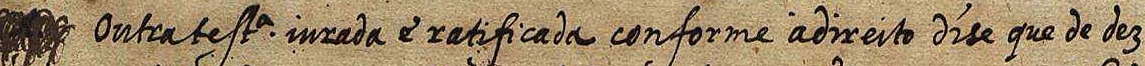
Outra testa. iurada e ratificada conforme a direito dise que de dez
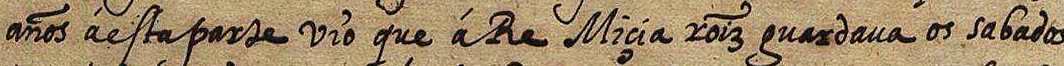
anōs á esta parte vio que á Re Miçia roīz guardaua os sabados
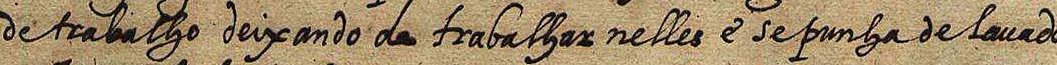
de trabalho deixando de trabalhar nelles e se punha de lauado
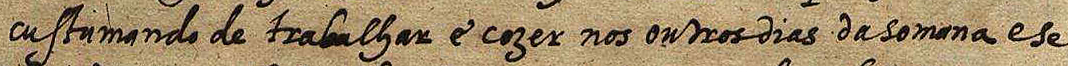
custumando de trabalhar e cozer nos outros dias da somana e se
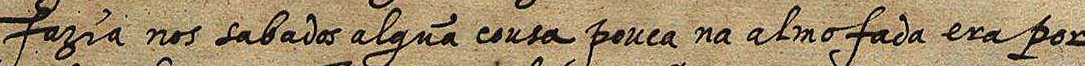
fazia nos sabados alguā cousa pouca na almofada era por
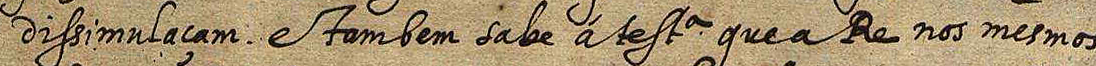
dissimulaçam e tambem sabe á testa. que a Re nos mesmos
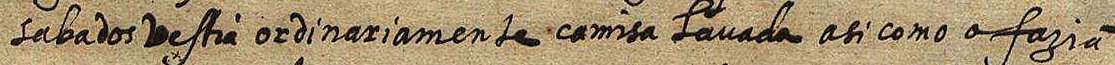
sabados vestia ordinariamente camisa lauada asi como o faziā
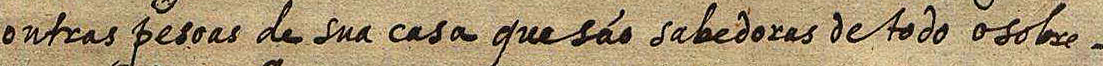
outras pesoas de sua casa que são sabedores de todo o sobre
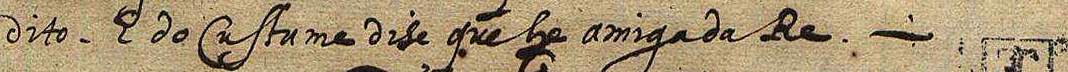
dito. E do Custume dise que he amiga da Re.
